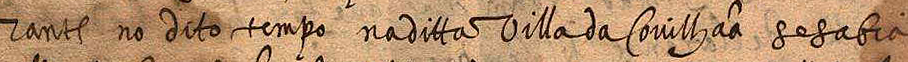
rante no dito tempo na ditta villa da Couilhaã se sabia
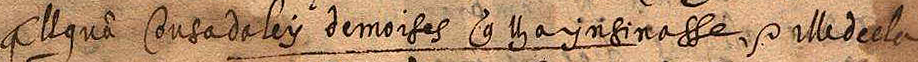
allgua̅ Cousa da ley de moises q̅ lha ynsinasse e elle decla
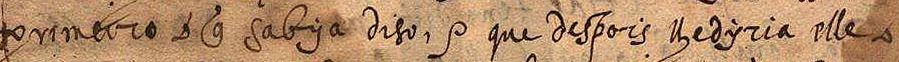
primeiro o q̅ sabya diso, e que despois lhe dyria elle o
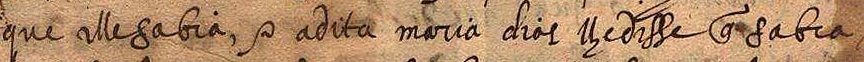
que elle sabia, e a dita maria dias lhe disse q̅ sabia //
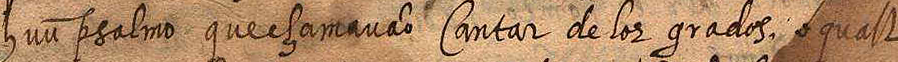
huu̅ psalmo que chamauaõ Cantar de los grados, o qualL
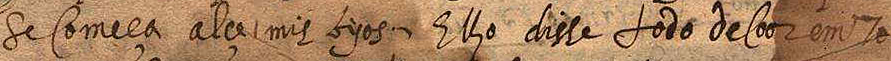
se Começa alçe / mis oyos; E lho disse todo de Coor em ro
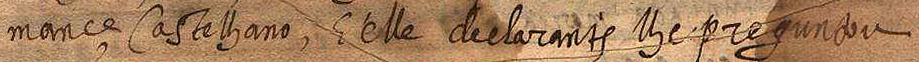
mançe Castelhano, E elle declarante lhe preguntou
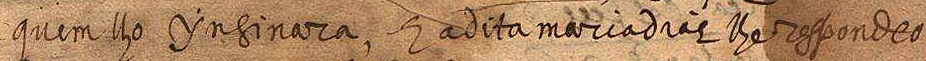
quem lho ynsinara, E a dita maria diaz lhe respondeo
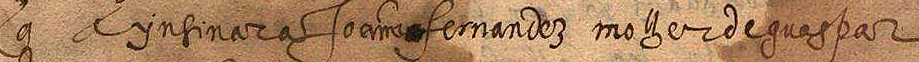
q̅ a ynsinara Joan̅a fernandez molher de guaspar
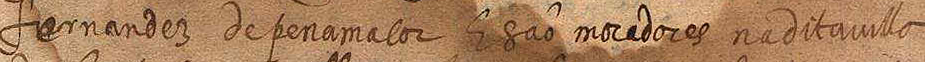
fernandez de penamacor E saõ moradores na dita uilla
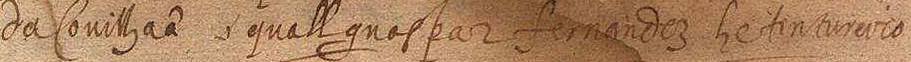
da Couilhaã o quall guaspar fernandez he tintureiro
